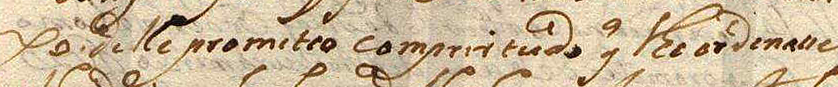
xo delle prometeo comprir tudo q̄ lhe ordenasse
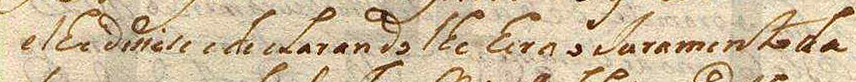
e lhe dissese e declarando lhe hera o Iuramento da
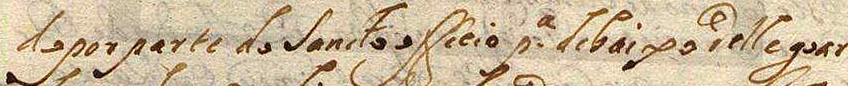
do por parte do Sancto officio p.a debaixo delle goar
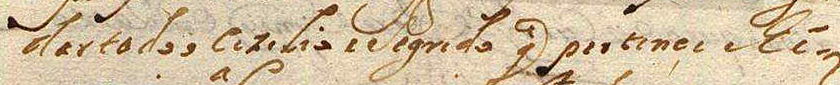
dar todo o cezilio e Segredo q̄ pertence e hé
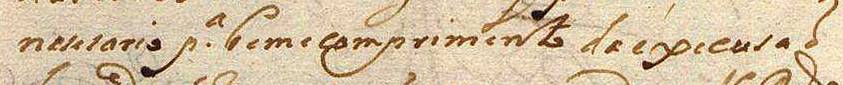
nesesario p.a bem e comprimento da execusaõ
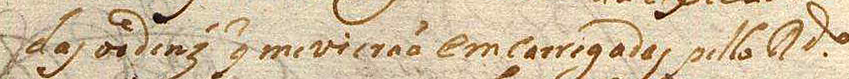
das ordenz̄ q̄ me vieraõ emcarregadas pello Rd.o
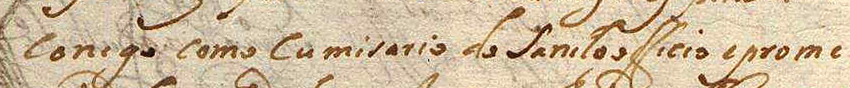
Conego como Cumisario do Sancto officio e prome
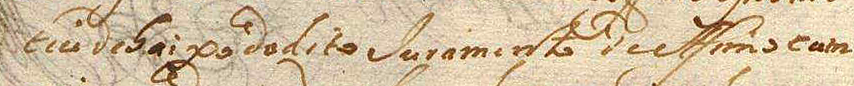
teu debaixo do dito Iuramento de Asim o cum
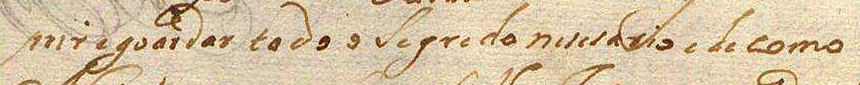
prir e goardar todo o segredo nesesario e de como
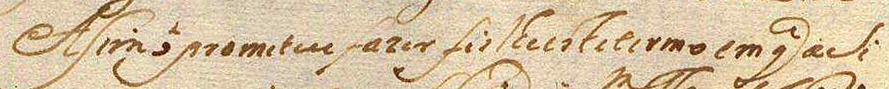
Asim o prometeu fazer fis lhe este termo em q̄ aSi
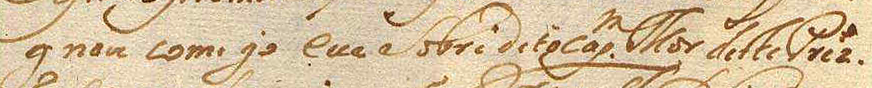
gnou comigo eu o Sobredito cap.m Mor deste Prez.o
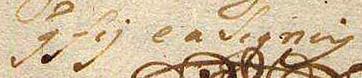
q̄ fis e asigney
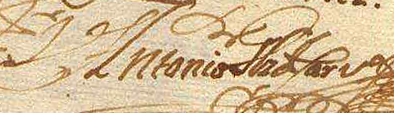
Antonio Glz d̄ Carvo
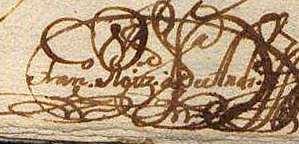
Fran.Co Roiz de Andr.e
